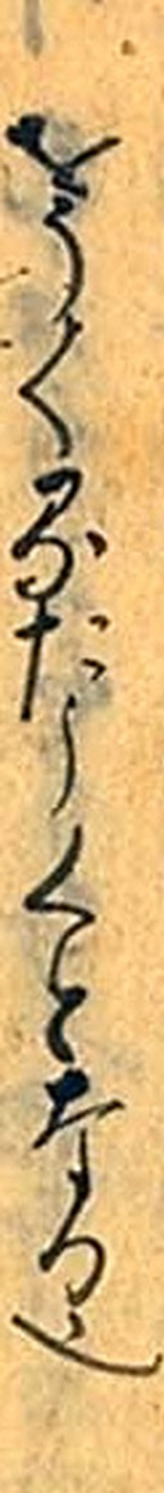をうくるたうくとなる也
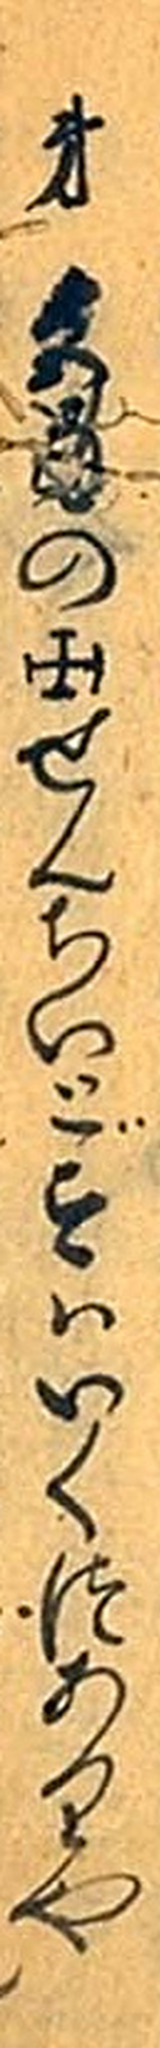弟色身の☩せんちいとすはいくつありや
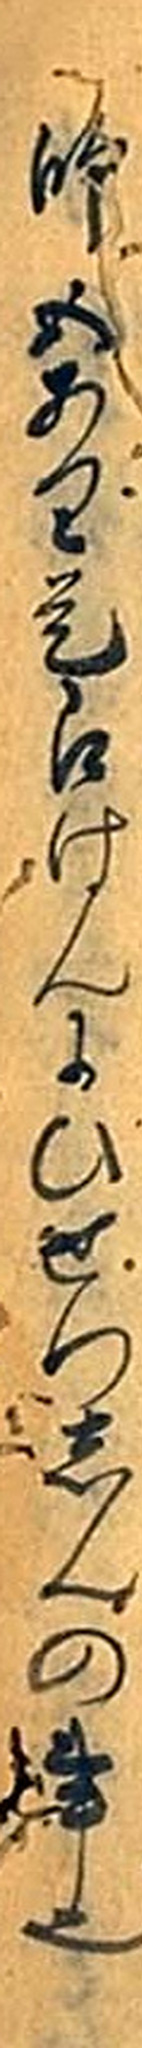師五あり是即けんにひせつしんの事也

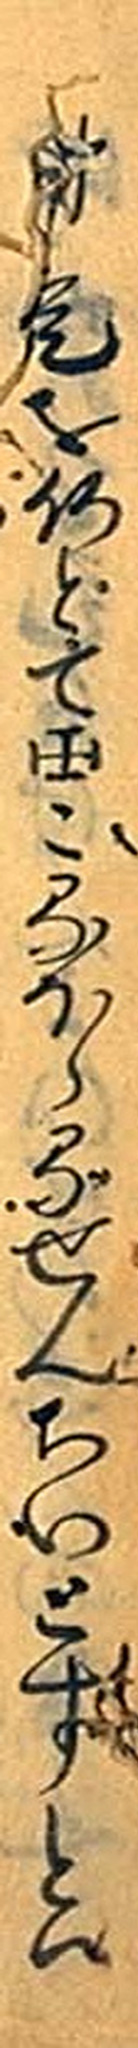弟是を何とて☩こるほらるせんちいとすとは
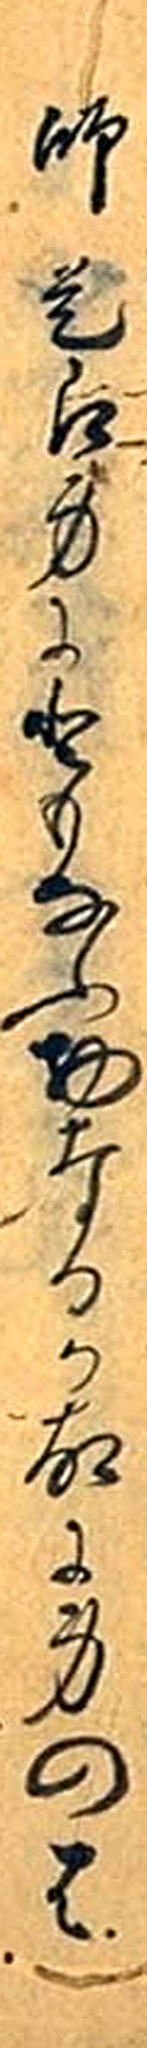師是即身にともなふ物なるか故に身のは
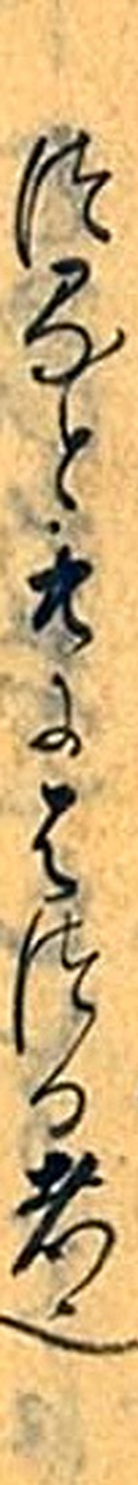つると共にはつる者也
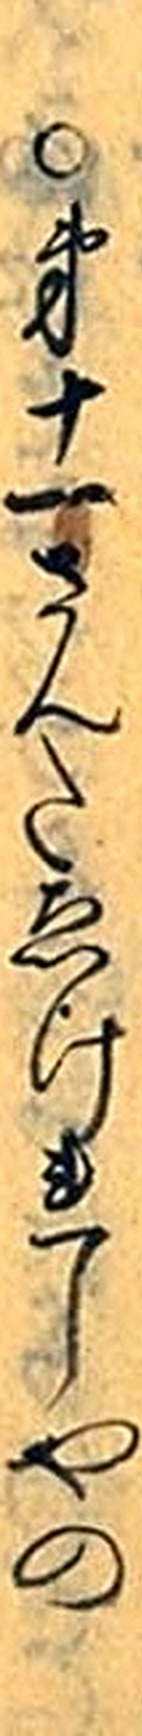○第十一さんたゑけれしやの
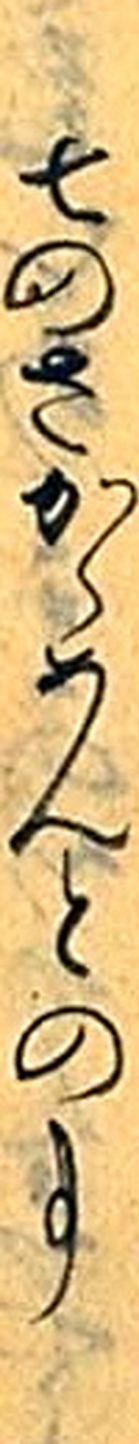七のさからめんとの事
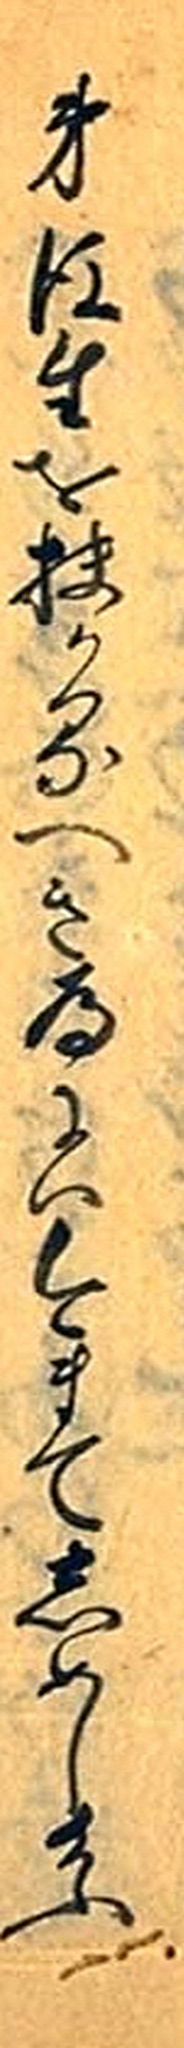弟後生を扶かるへき為には今まてしめし給ふ
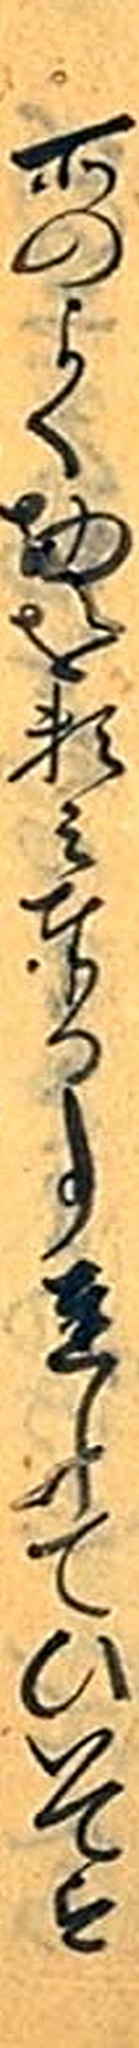所のよく物を頼み奉る事達してひいてす
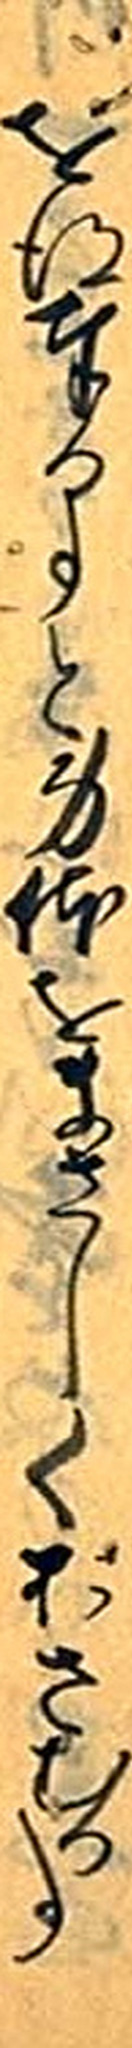を得奉る事と身体をまさしくおさむる事
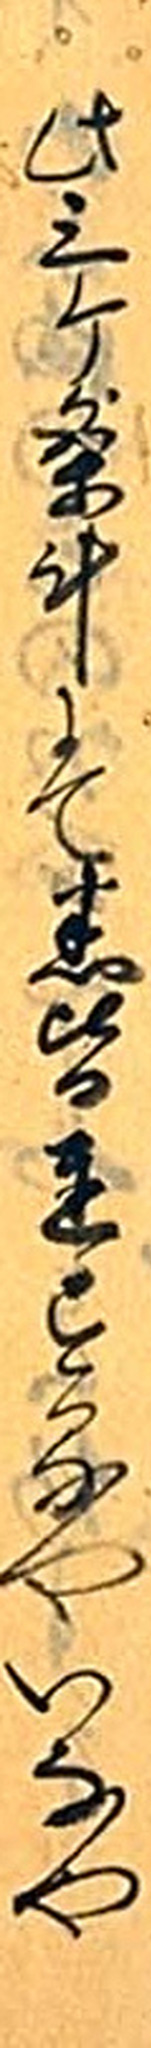此三ケ条計にて悉皆達するやいなや
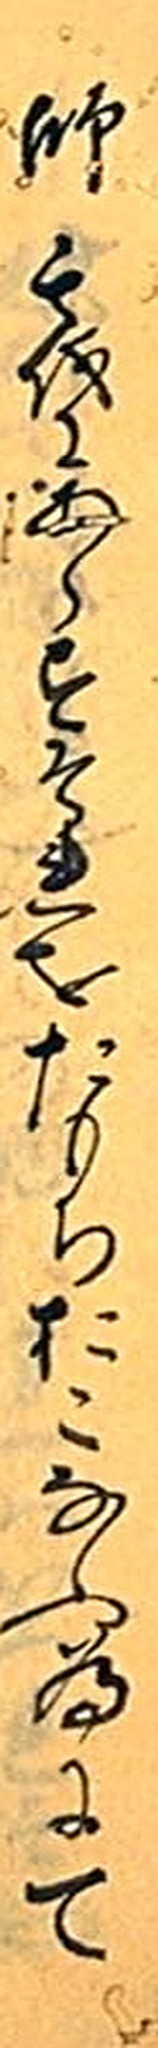師其儀にあらすそれをたもちおこなふ為にて
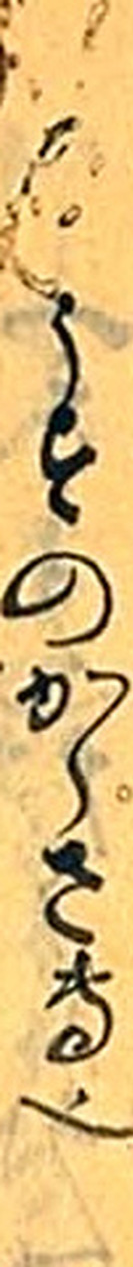うすのからさ専也
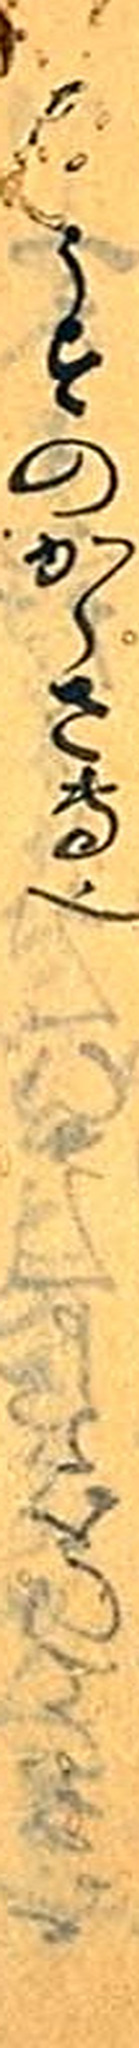うすのからさ専也
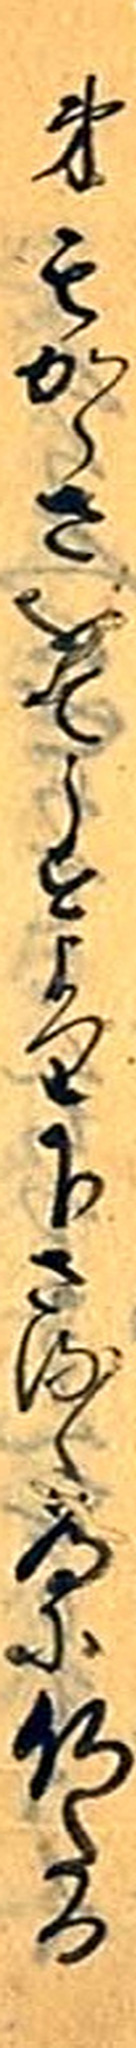弟其からさをてうすより下さるゝ為に何たる
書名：ドチリナ・キリシタン
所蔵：東京大学総合図書館 / General Library in the University of Tokyo
